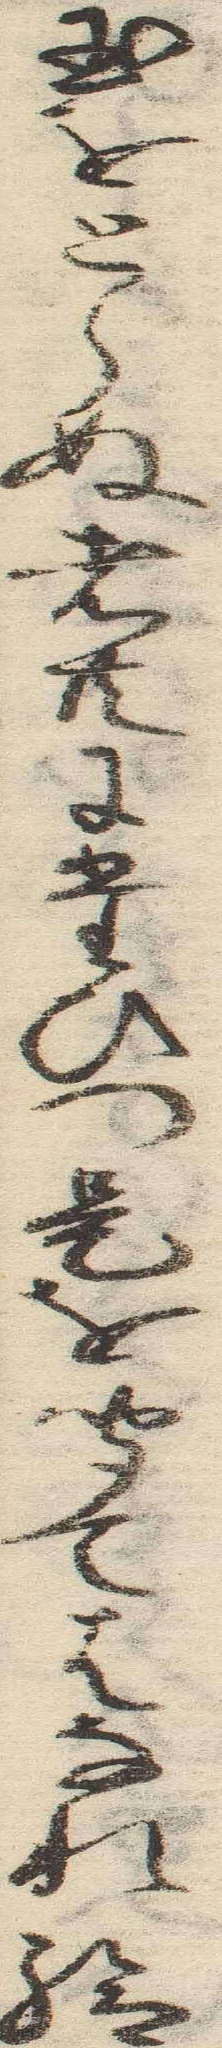玉をとらぬ者共にたひつ是を聞てはなれ給

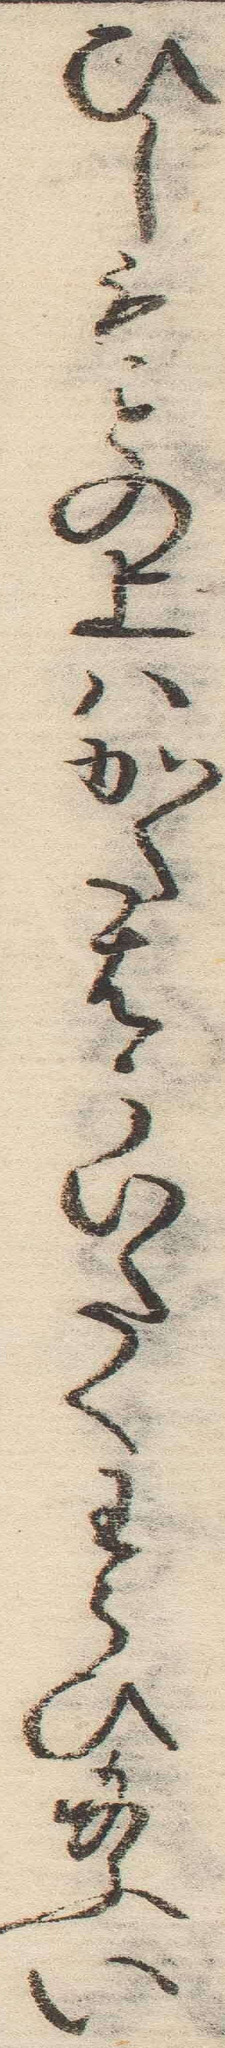ひしもとの上はかたはらいたくわらひ給ふい
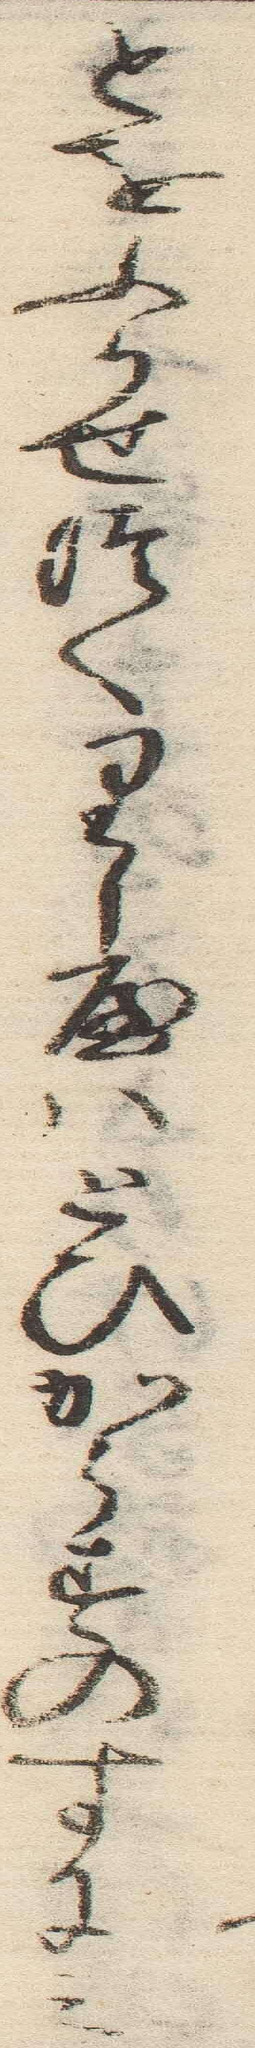とをふかせつくりし屋はとひからすのすにみ
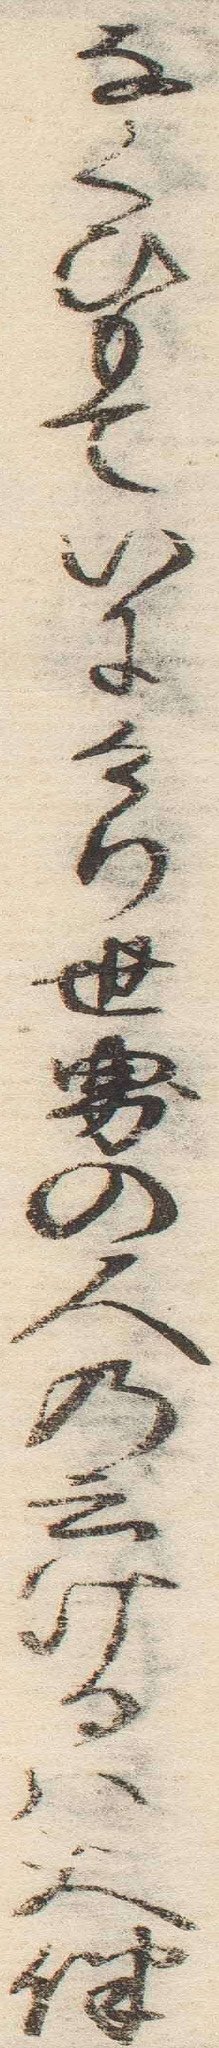なくひもていにけり世界の人の云ひけるは大伴
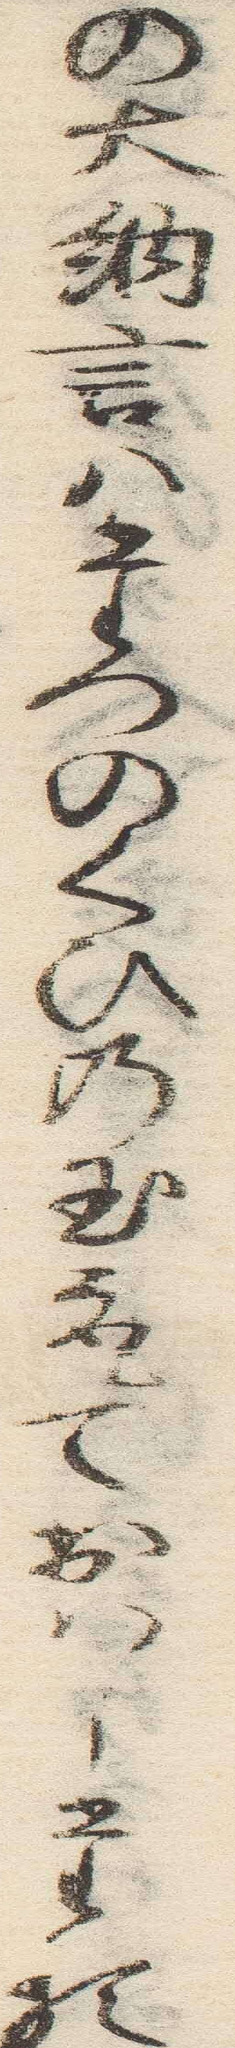の大納言はたつのくひの玉取ておはしたる
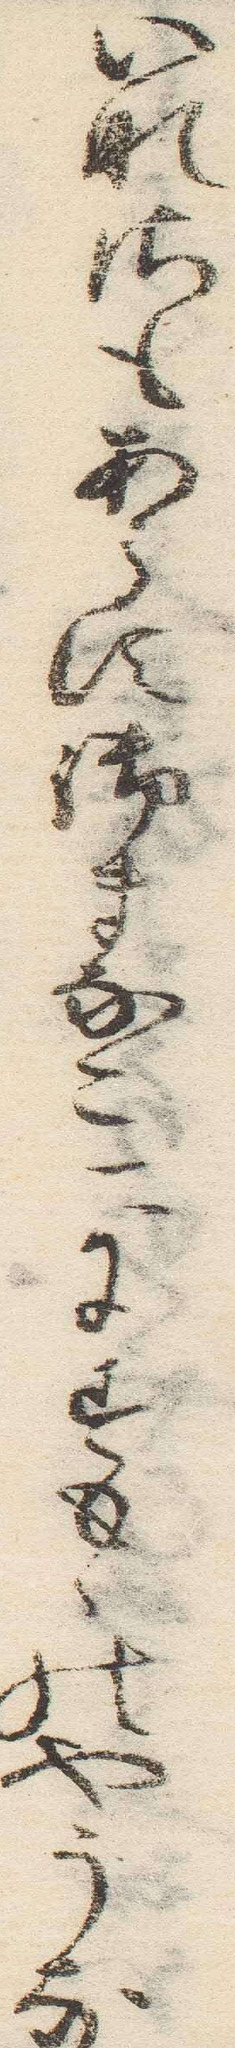いなさもあらす御まなこ二にすもゝのやうな
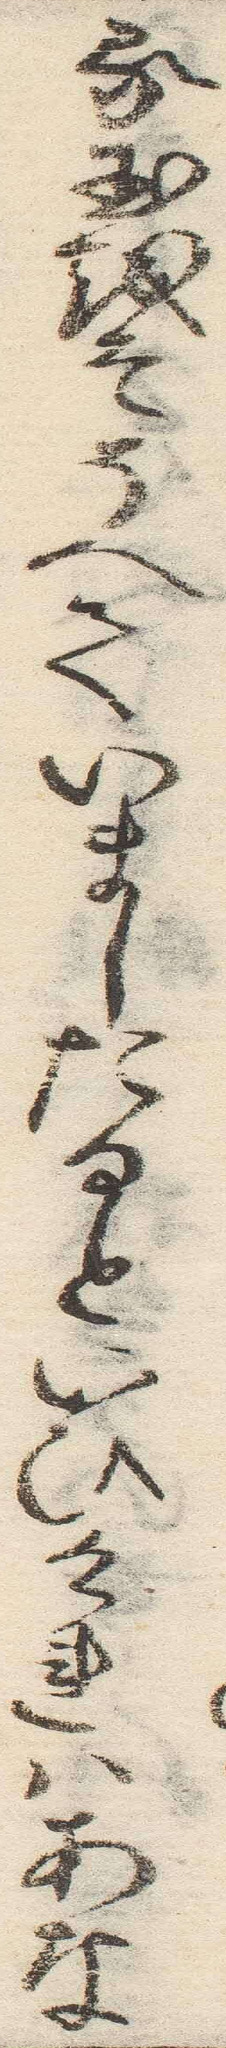る玉をそそへていましたるといひけれはあな
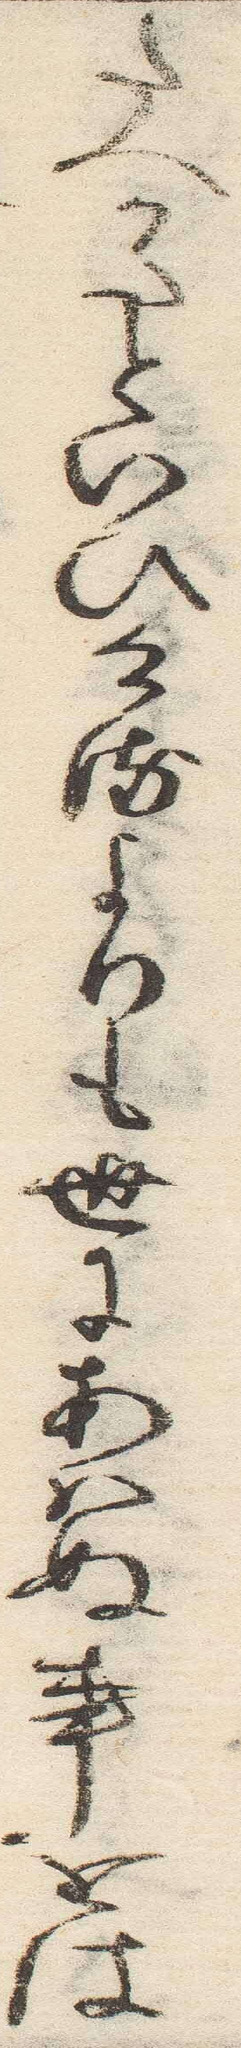たへかたといひけるよりも世にあはぬ事をは
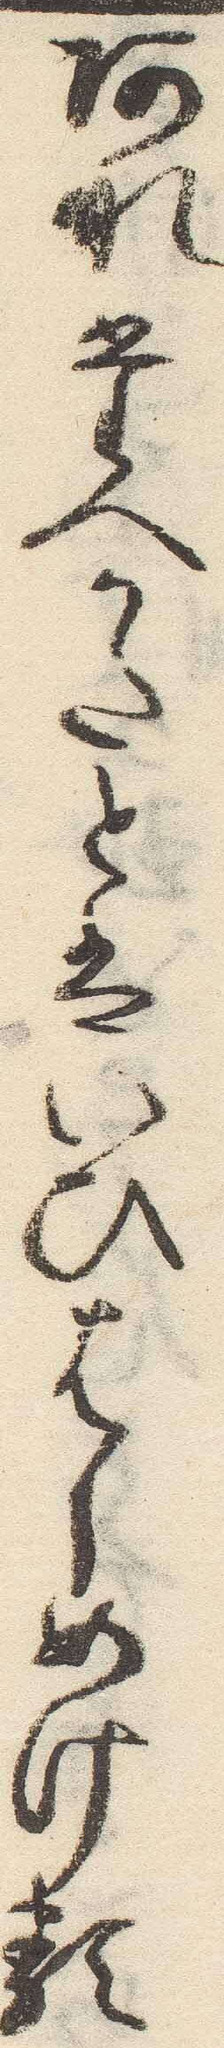あなたへかたとはいひはしめける
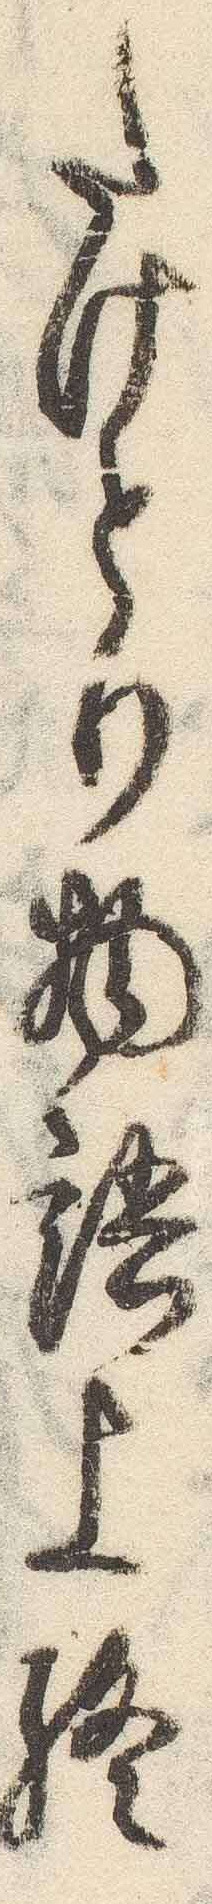たけとり物語上終
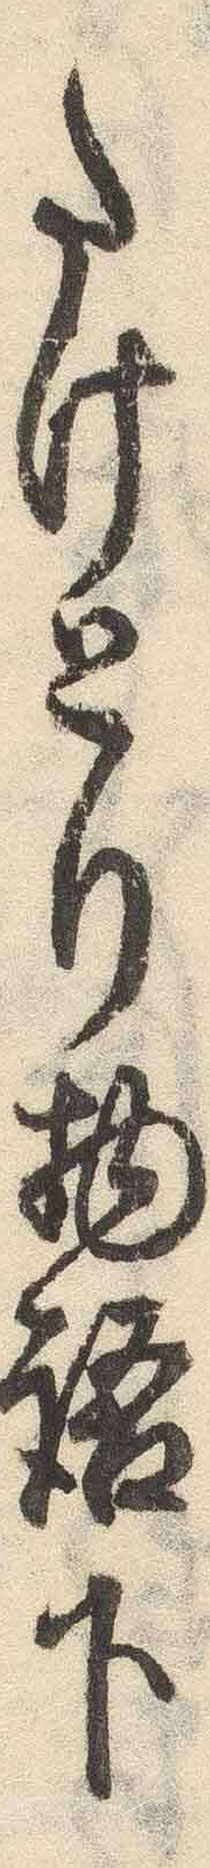たけとり物語下
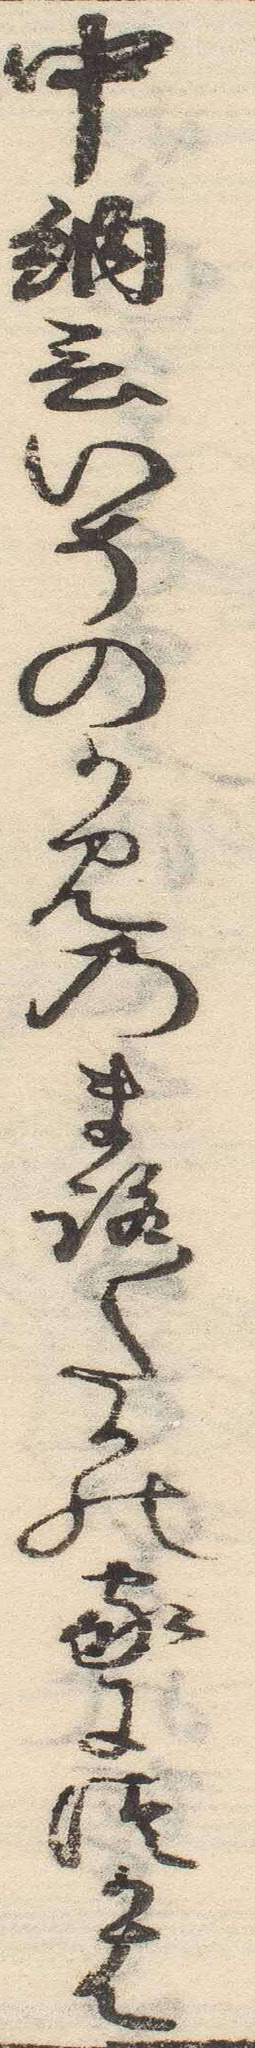中納言いそのかみのまろたかの家につかは
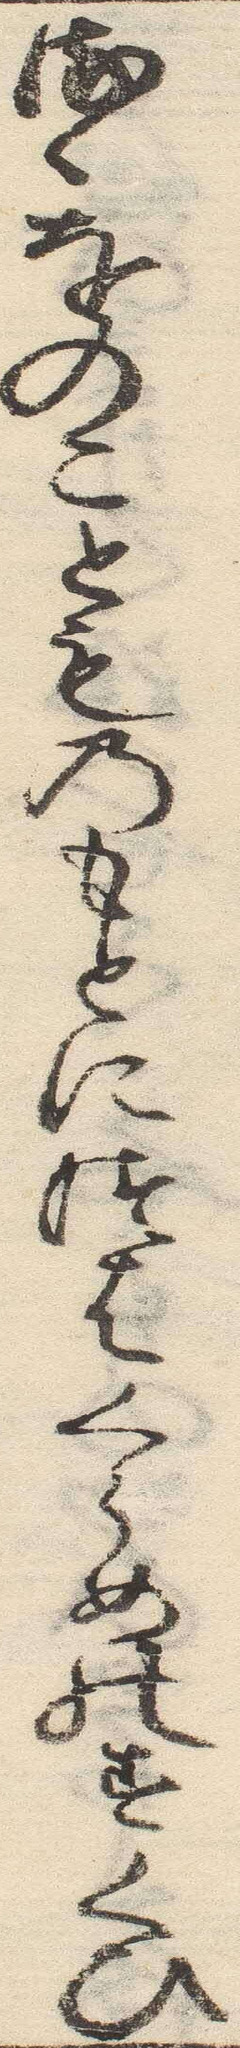るゝをのことものもとにつはくらめのすくひ
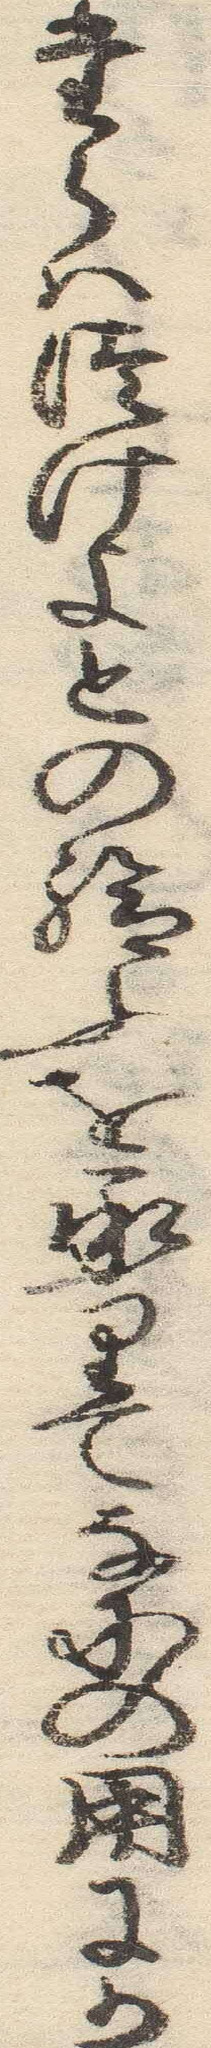たらはつけよとの給ふを承りてなにの用にか
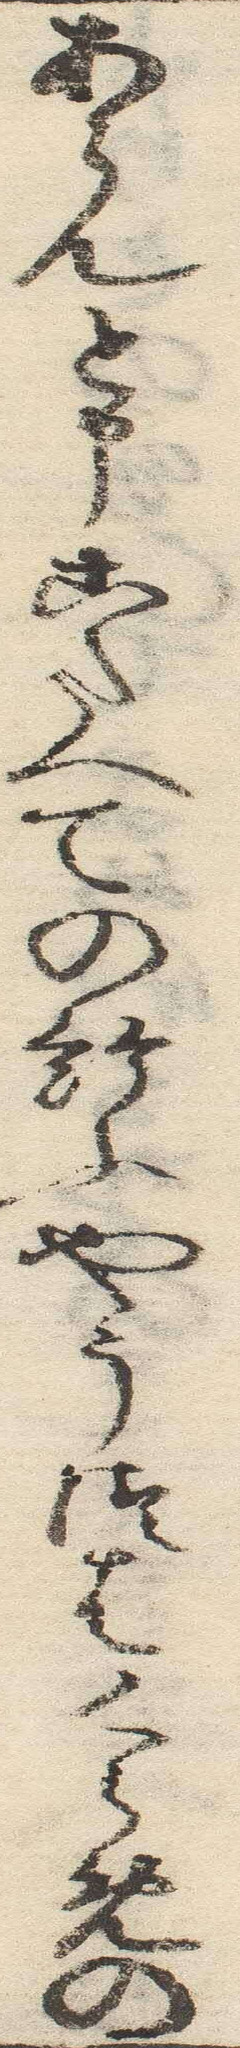あらんと申こたへての給ふやうつはくらめの
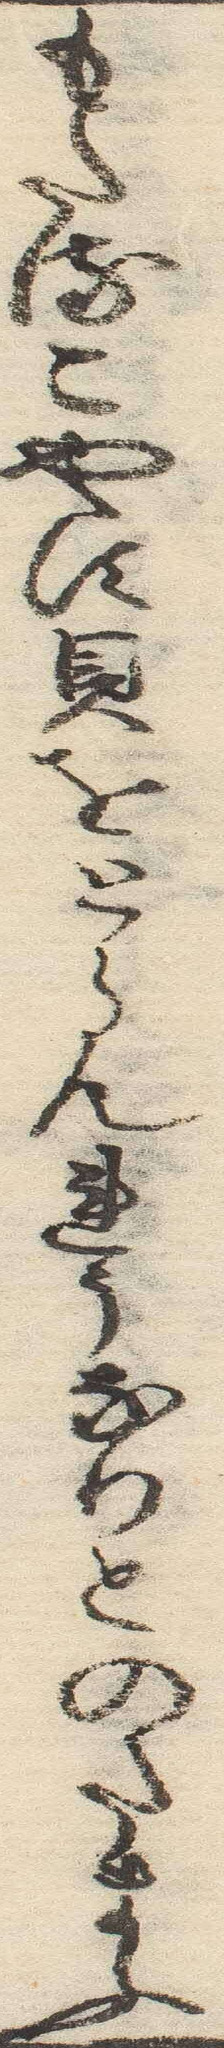もたるこやす貝をとらんれうなりとのたもふ
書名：竹取物語
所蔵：東京学芸大学附属図書館 国文学研究資料館
